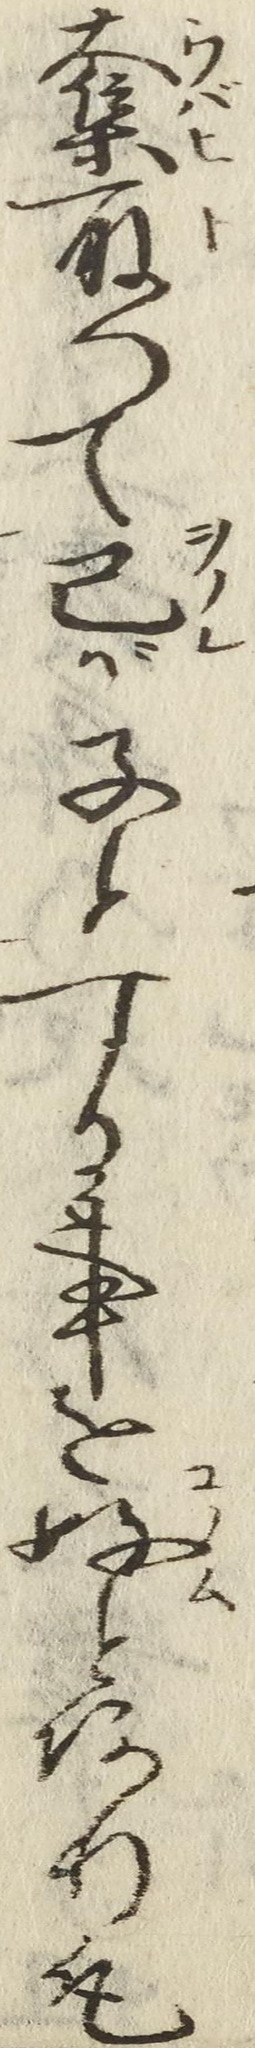奪取つて己が子とする事を好とあり凡
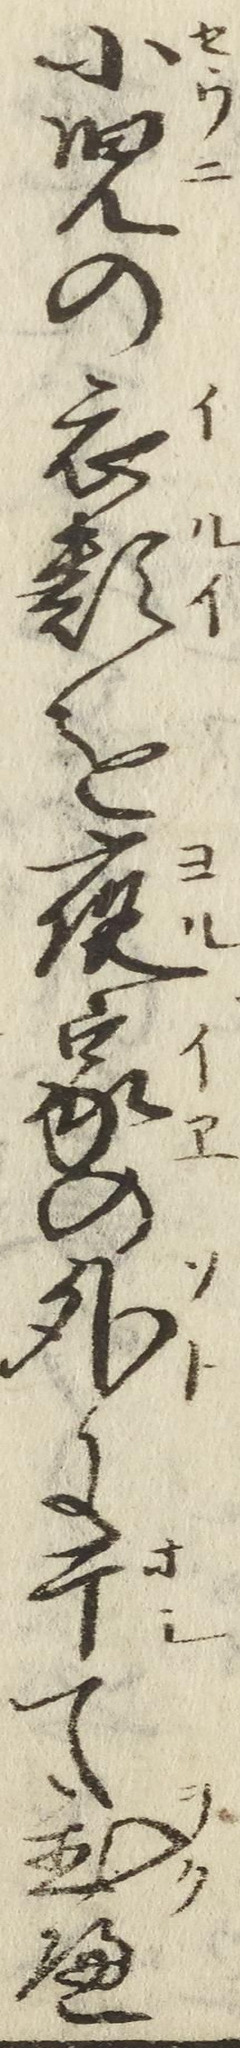小児の衣類を夜家の外に干て置へ
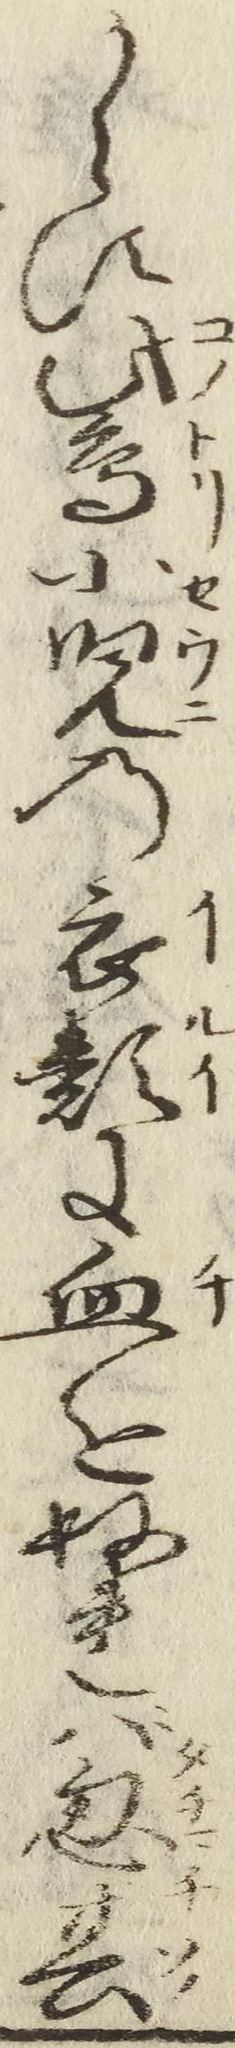からす此鳥小児の衣類に血をぬれば忽其
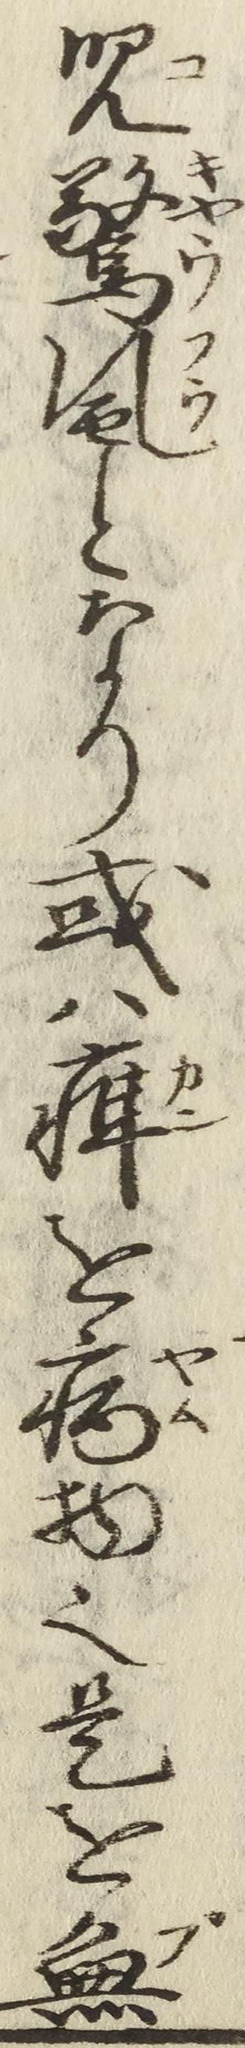児驚風となり或は疳を病物也是を無
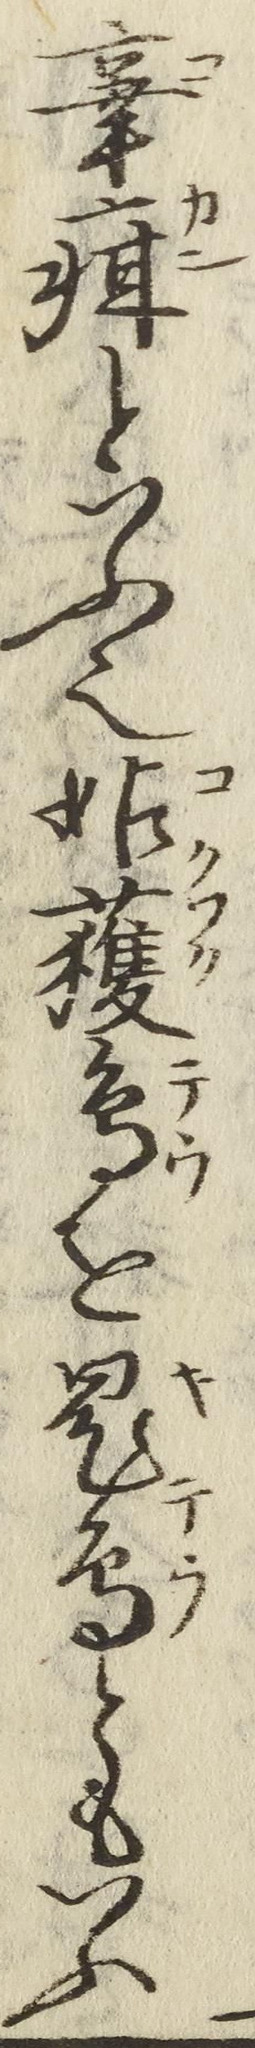辜疳といふ也姑獲鳥を鬼鳥ともいふ

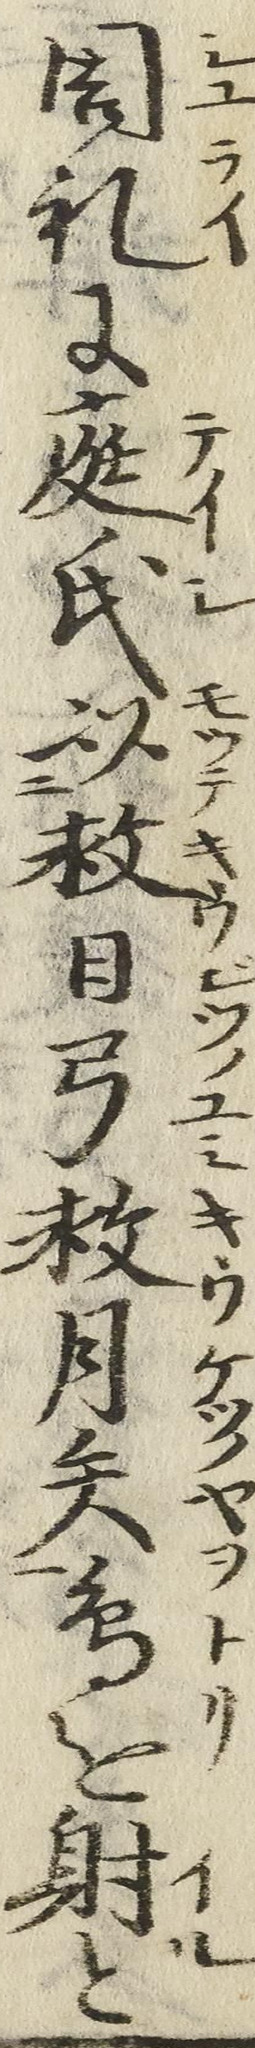周礼に庭氏以救日弓救月矢鳥を射と
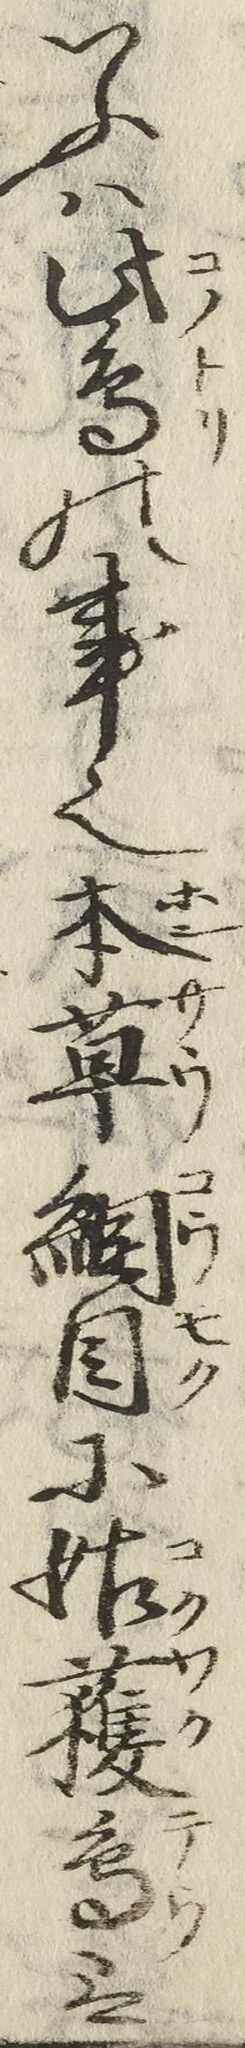いふは此鳥の事也本草綱目に姑獲鳥は
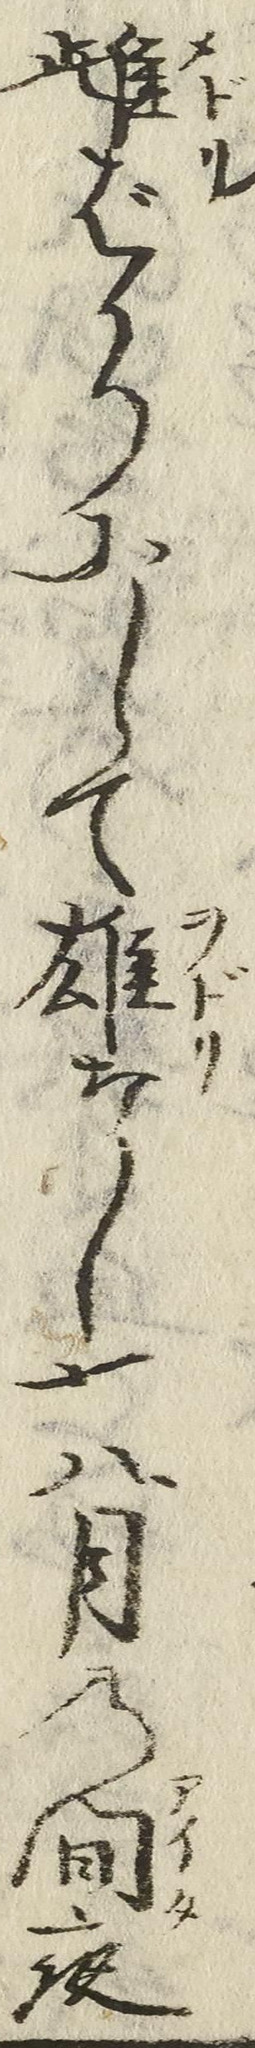雌ばかりにして雄なし七八月の間夜
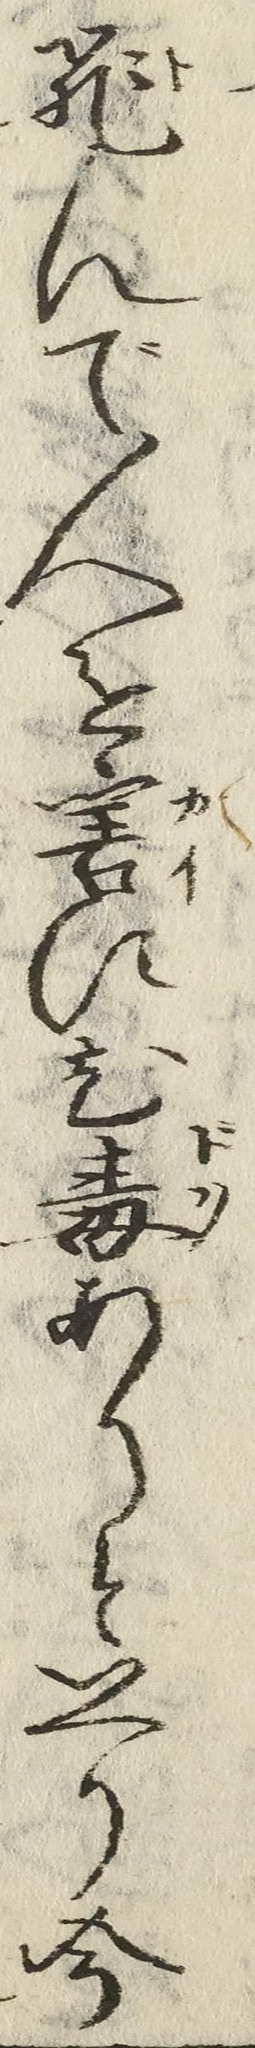飛んで人を害す尤毒ありといへり今
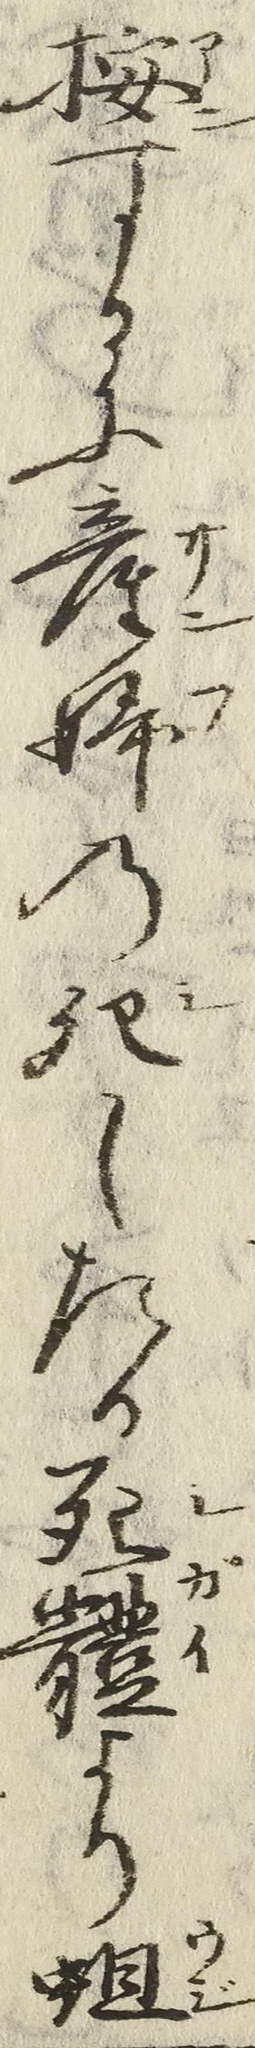按するに産婦の死したる死体より蛆
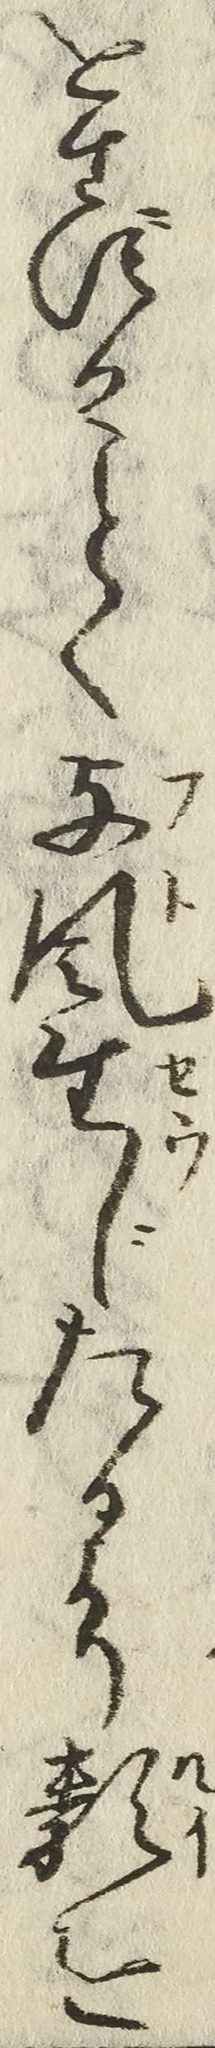を生ずかことく与風生じたるより類を
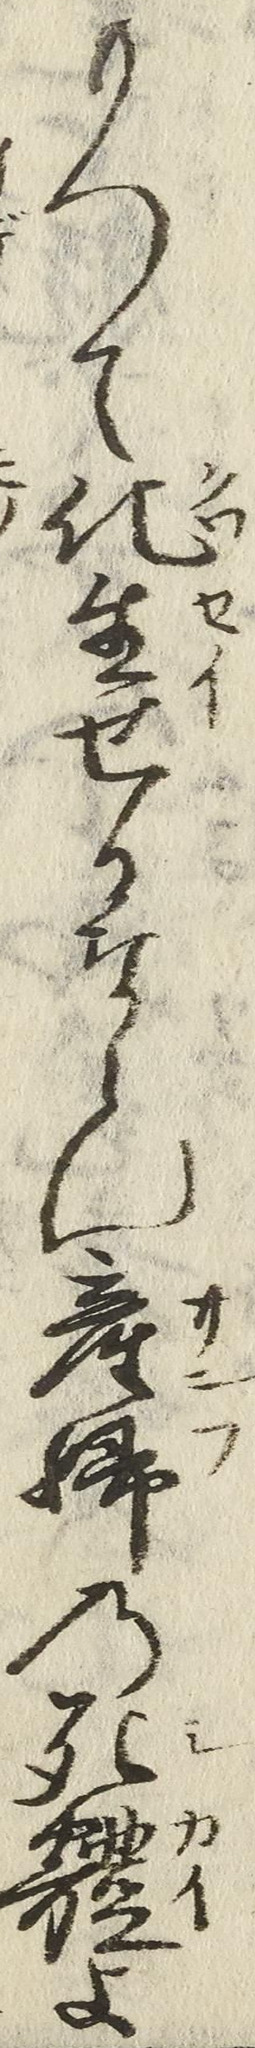もつて化生せるならん産婦の死体よ
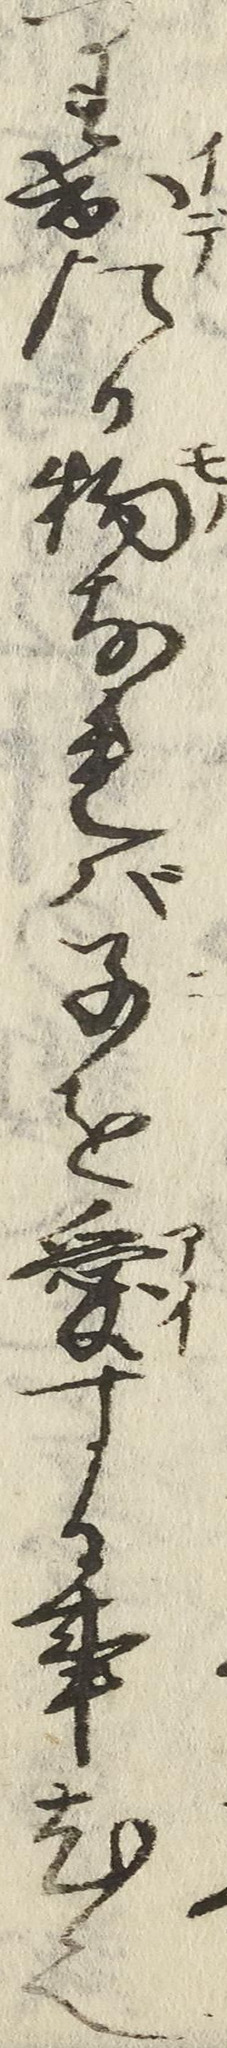り出たる物なれば子を愛する事尤也
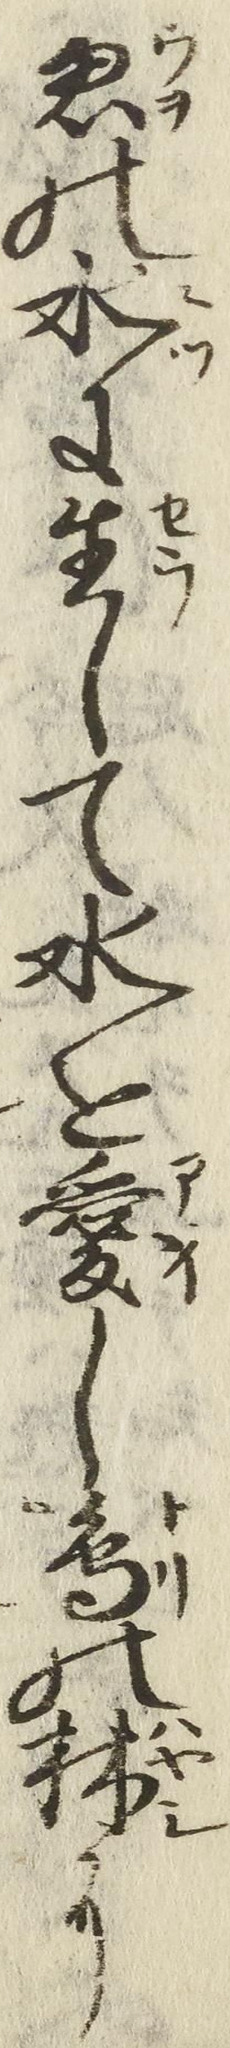魚の水に生して水を愛し鳥の林に
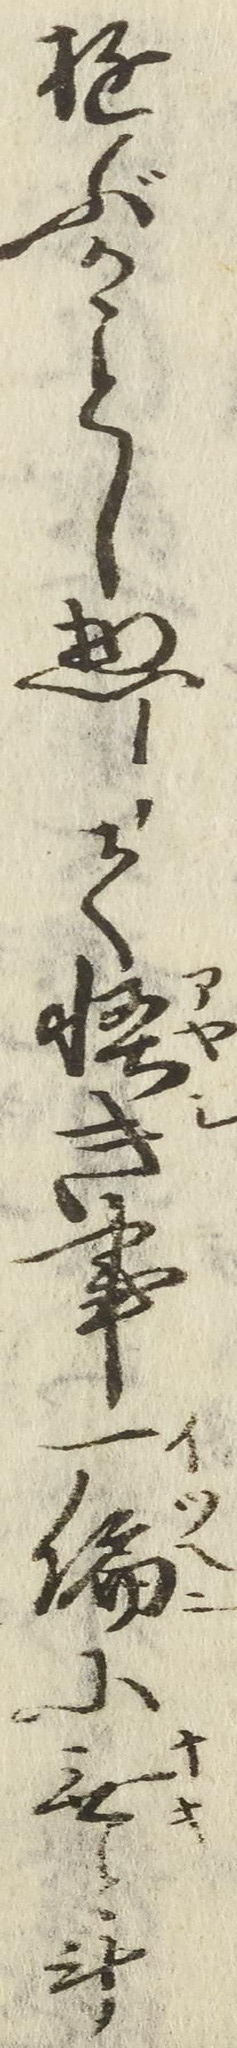遊ぶかことし惣して怪き事一偏に無と計
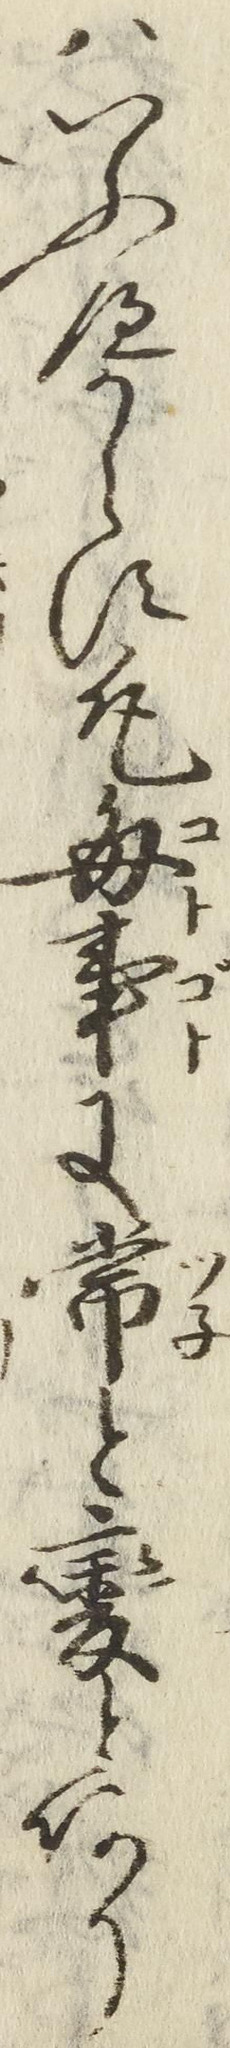はいふへからす凡毎事に常と変とあり
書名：天地或問珍　地
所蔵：東京大学地震研究所図書室 Earthquake Research Institute Library, The University of Tokyo, JAPAN
